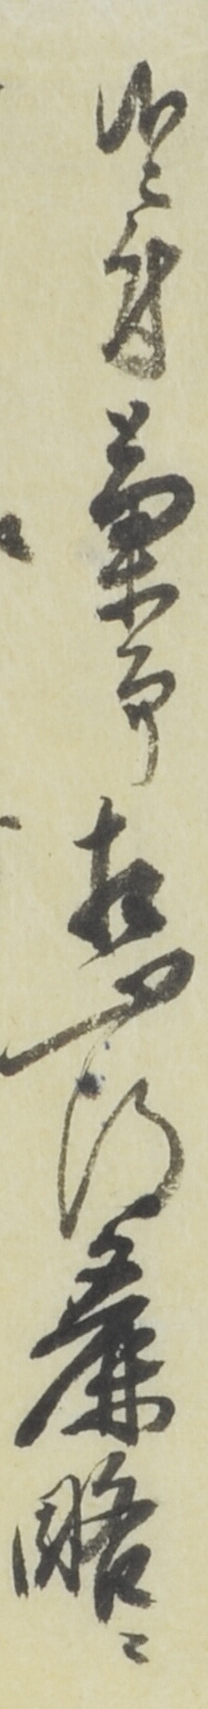候ニ付兼而相心得麁略ニ
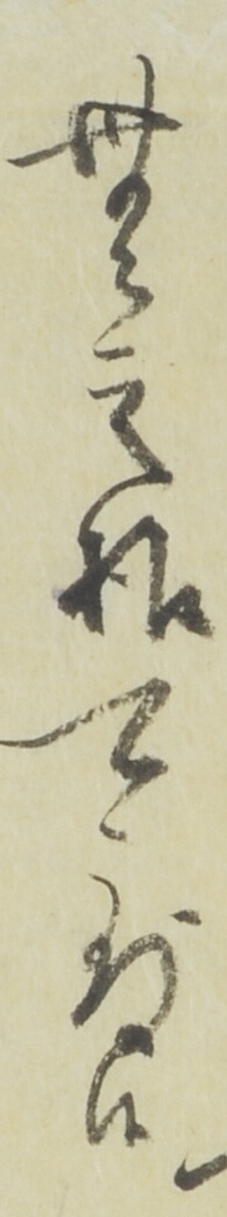無之様可致候
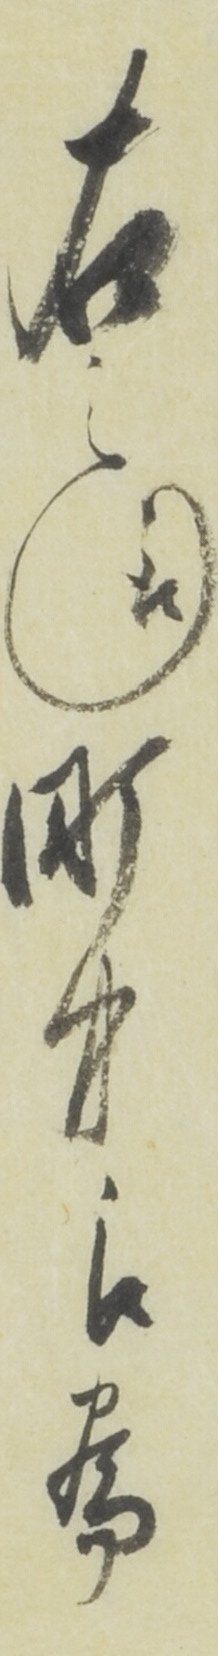右之趣町中江為
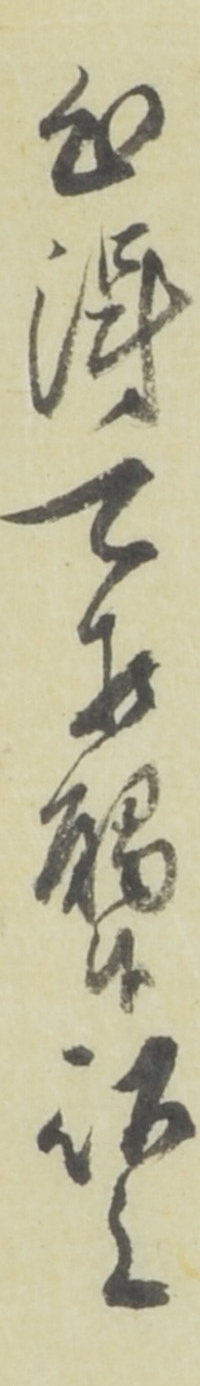心得可相触候以上
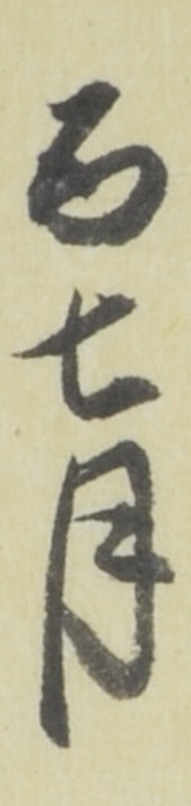酉七月
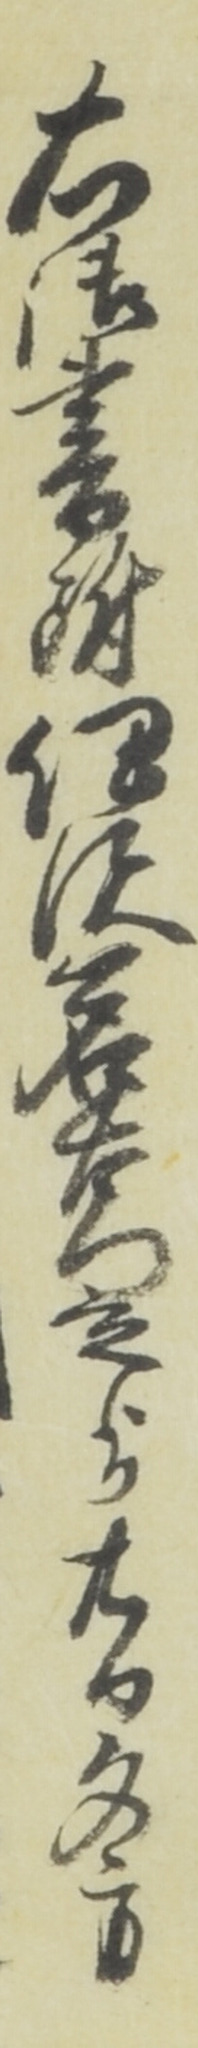右御書附伊沢岩右衛門殿より廿日夕方
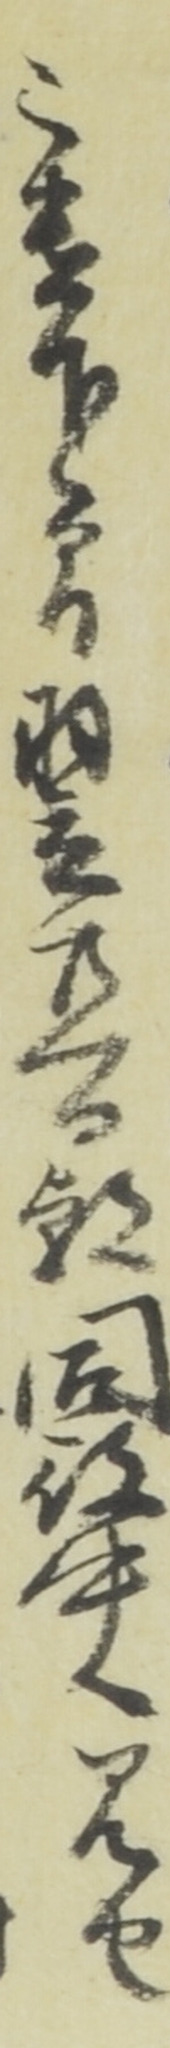被遣下候間翌廿一日朝同役中へ見せ
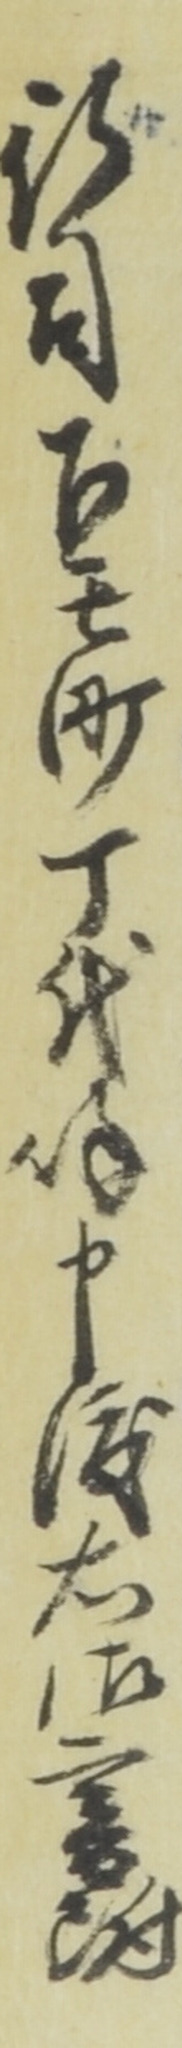行司下モ町丁代呼申渡右御書附

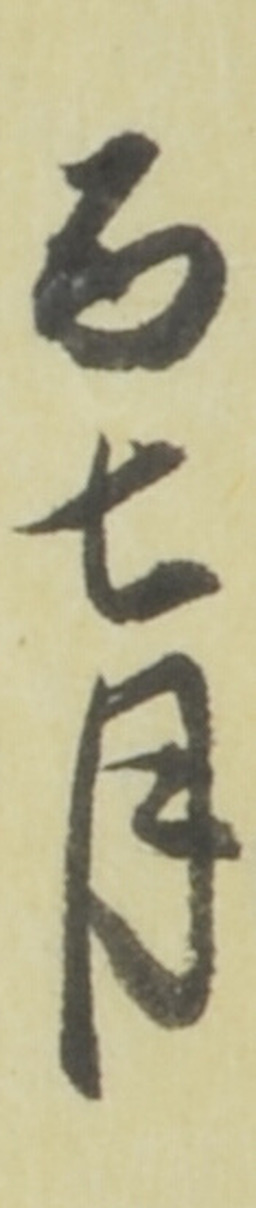酉七月
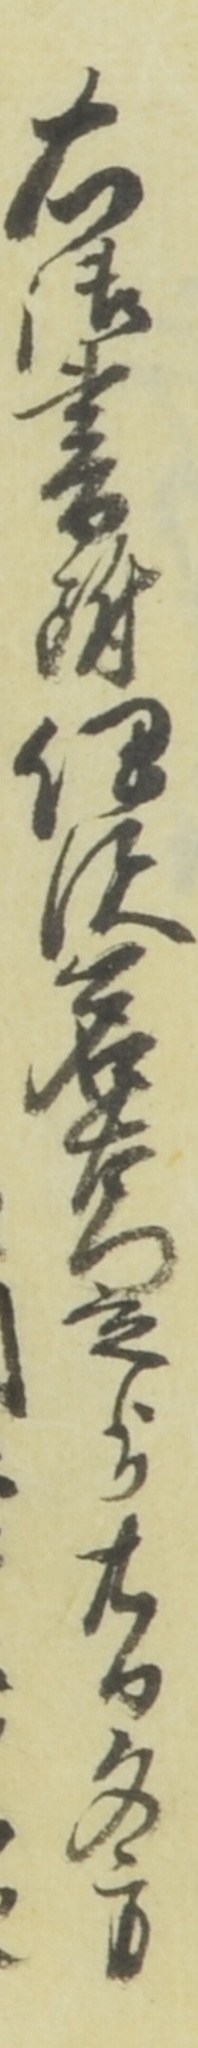右御書附伊沢茗右衛門殿より廿日夕方
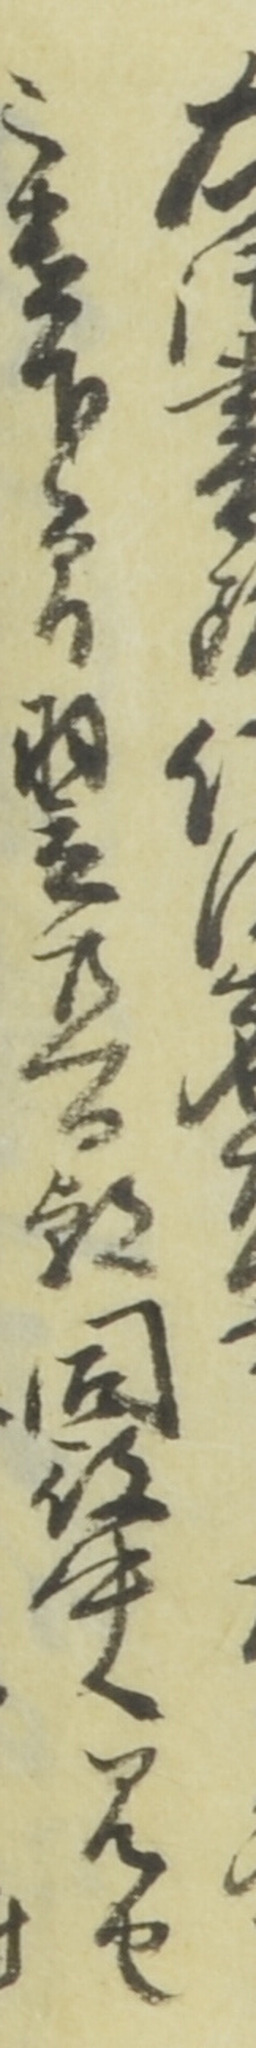被遣下候間翌廿一日朝同役中へ見せ
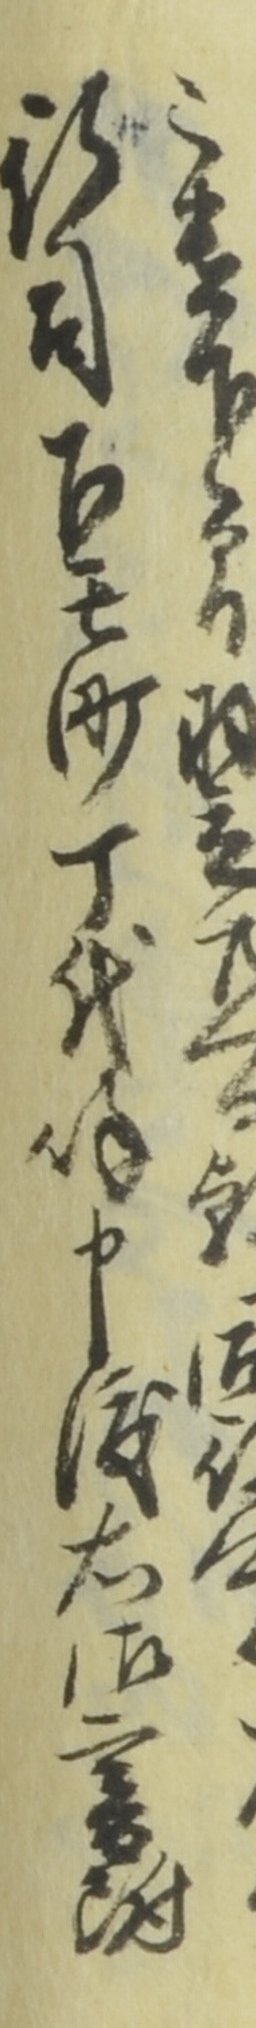行司下モ町丁代呼申渡右御書附
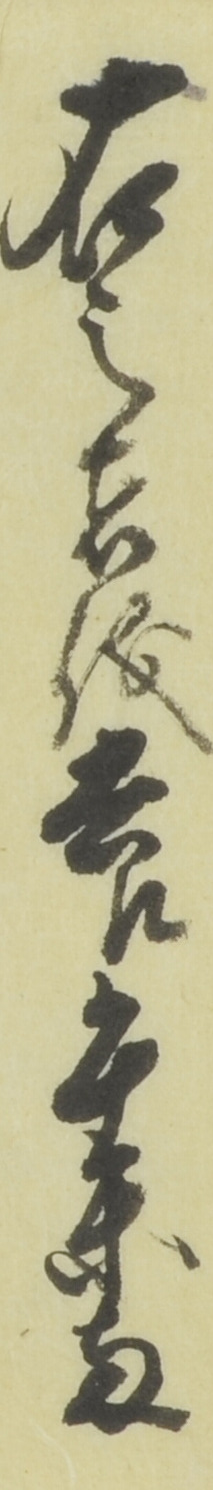右之者儀去ル午末両
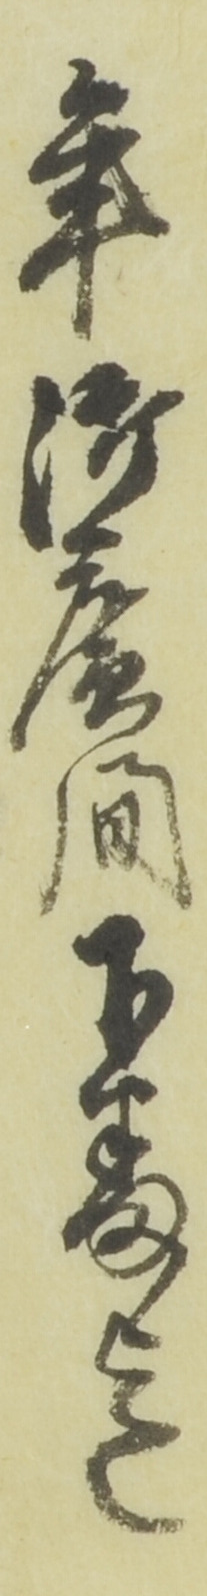年御広間下番迄
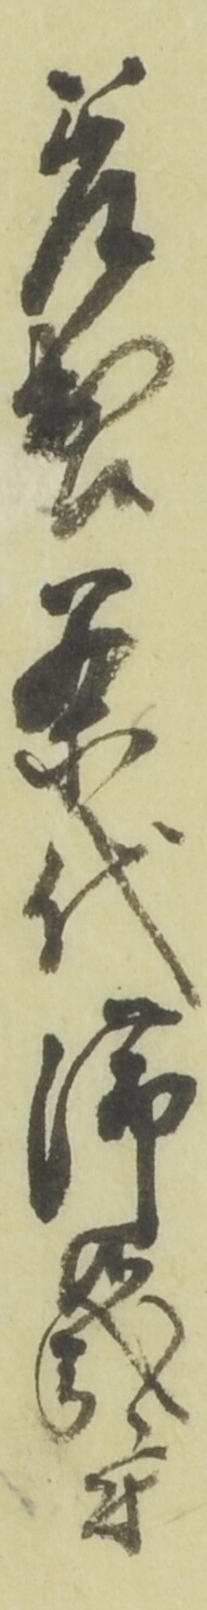差出候茶代滞候哉ニ付
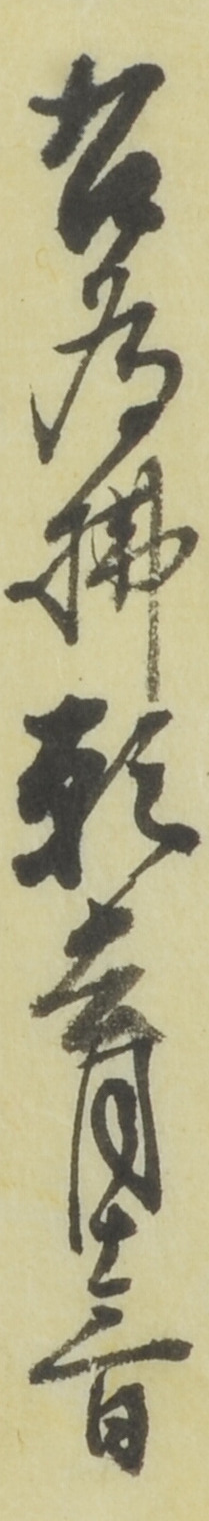右為払願去月十三日
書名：御触書御書附控
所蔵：伊那市立高遠町図書館・合同会社AMANE
